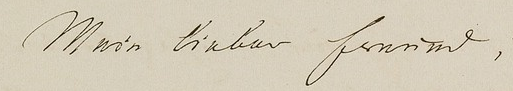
Mein lieber Freund!
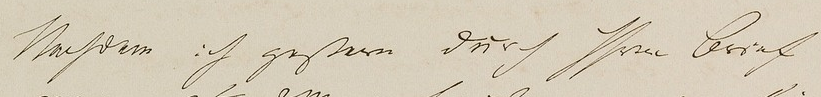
Nachdem ich gestern durch Ihren Brief
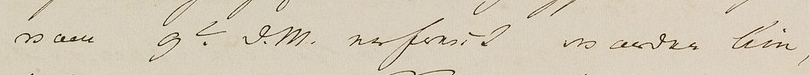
vom 9t d. M. erfreut worden bin,
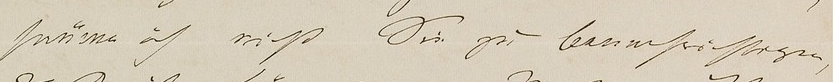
seume ich nicht Sie zu benachrichtigen,
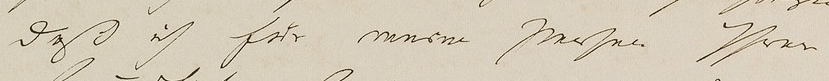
daß ich für meine Person Ihrer
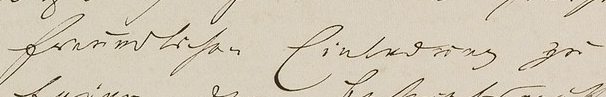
freundlichen Einladung zu der
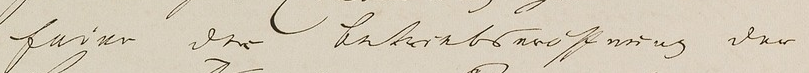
Feier der Betriebseröffnung der
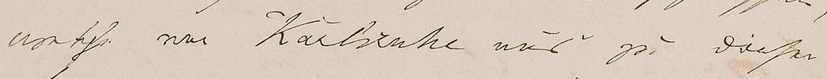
welche von Karlsruhe aus zu dieser
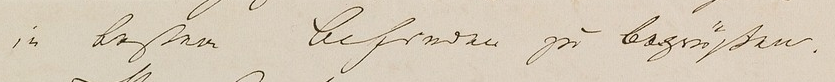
in bestem Befinden zu begrüßen.
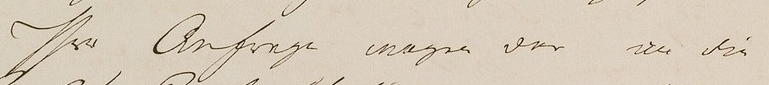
Ihre Anfrage wegen der an die
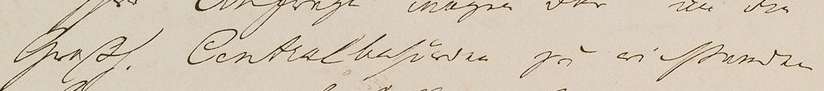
Großh. Centralbehörden zu richtenden
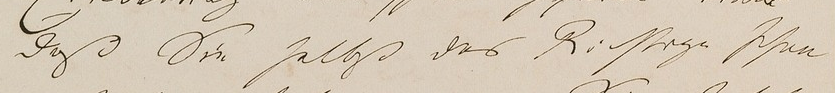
daß Sie selbst das Richtige schon
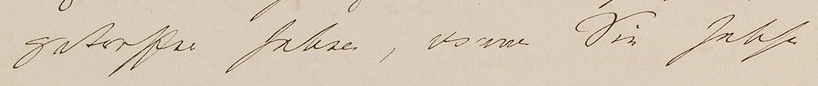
getroffen haben, wenn Sie solche
